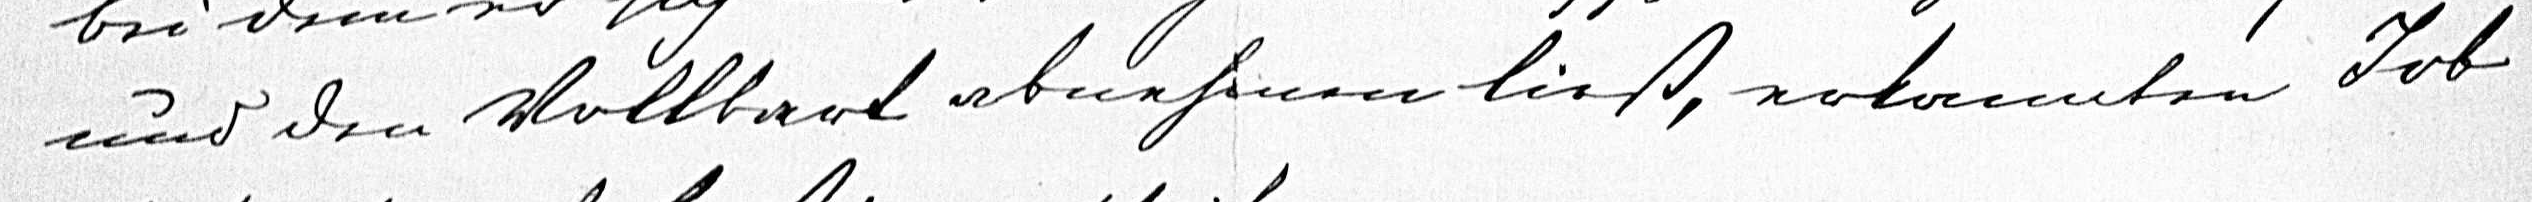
und den Vollbart abnehmen ließ, erkannten Job
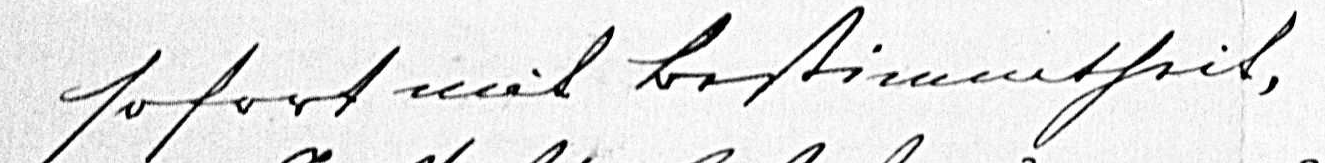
sofort mit Bestimmtheit.
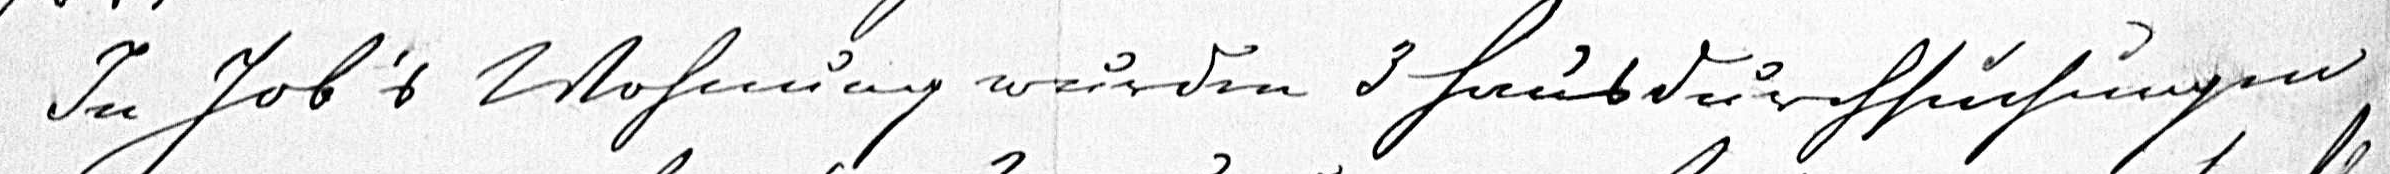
In Job’s Wohnung wurden 3 Hausdurchsuchungen
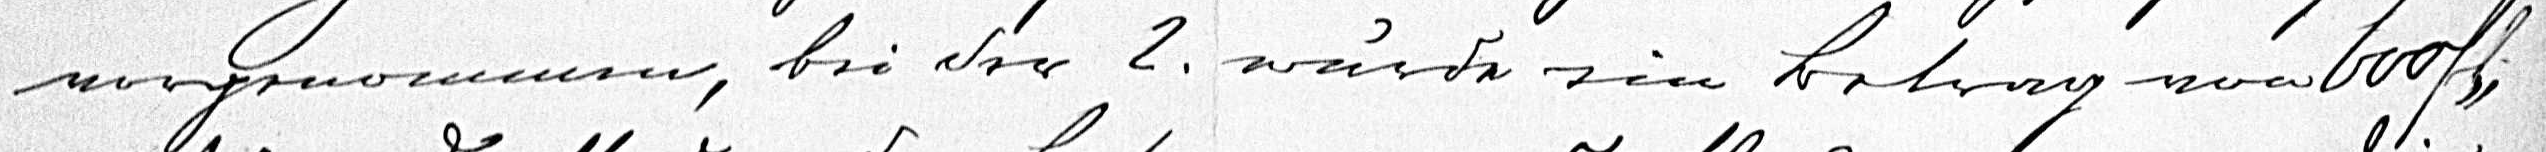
vorgenommen, bei der 2. Wurde ein Betrag von 600fl
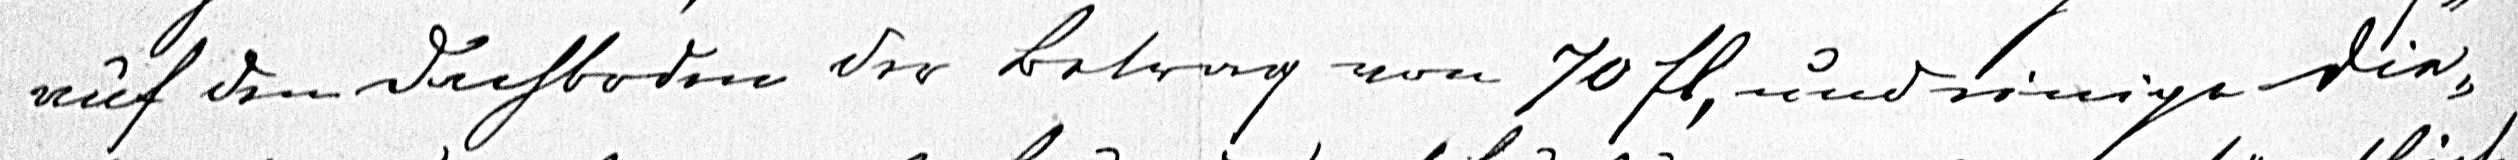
auf den Dachboden der Betrag von 70 fl, und einige die¬
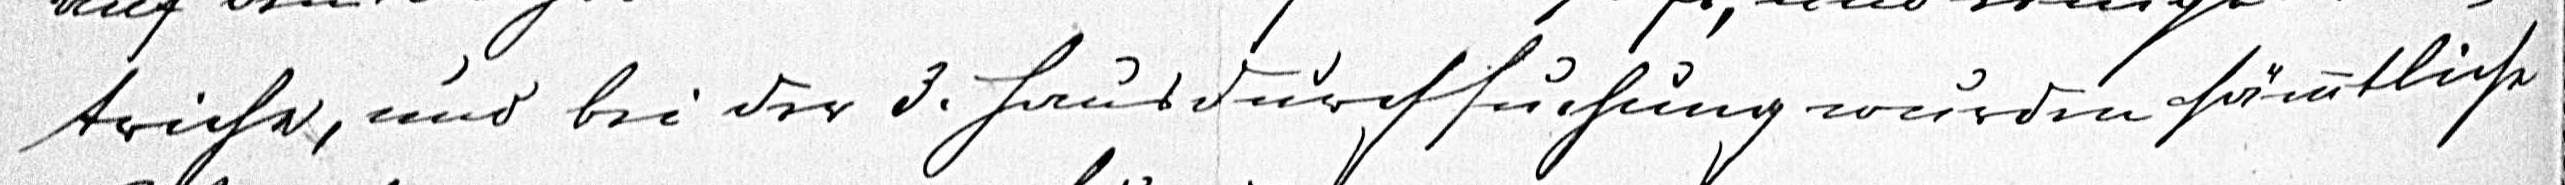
triche, und bei der 3. Hausdurchsuchung wurden sämtliche
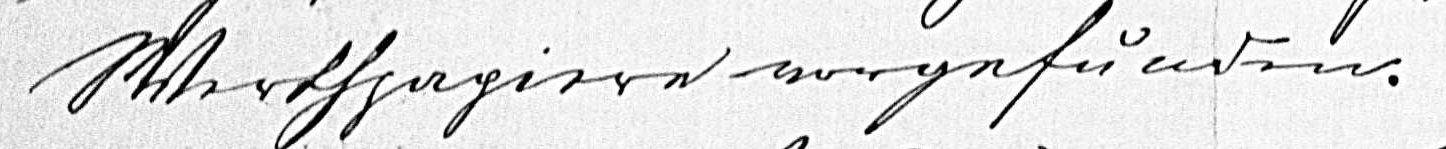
Werthpapiere vorgefunden.
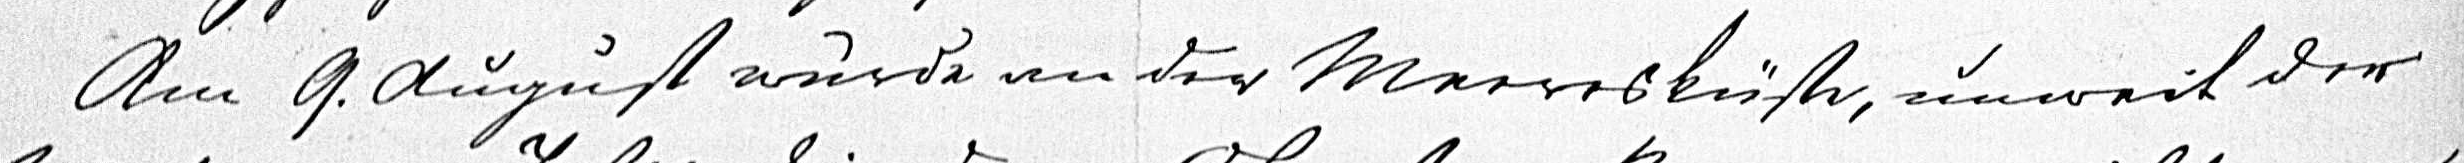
Am 9 August wurde an der Meeresküste, unweit der
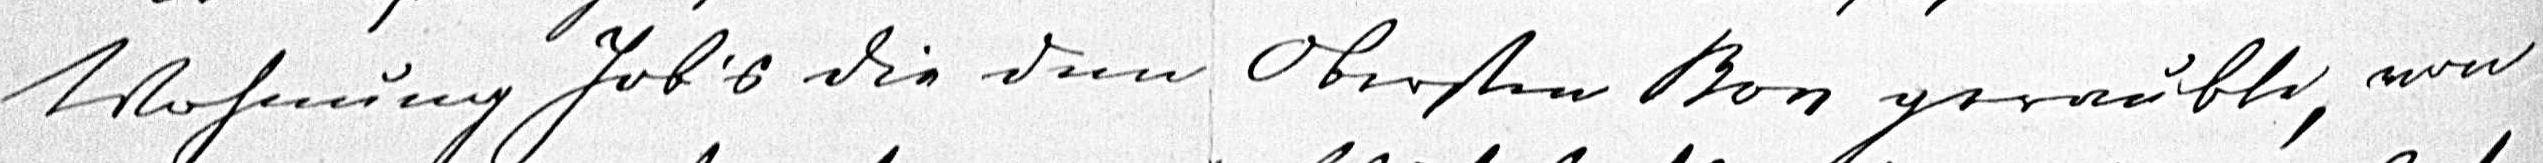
Wohnung Job’s die den Obersten Bon geraubt, von
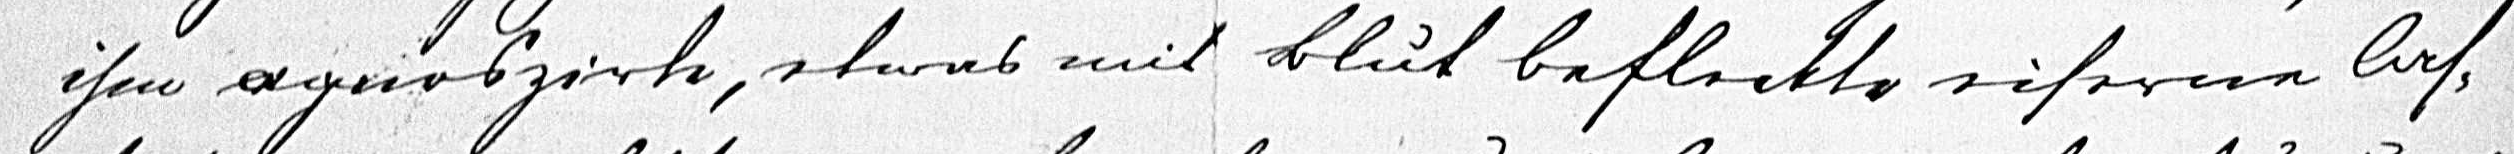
ihm agnoszirte, etwas mit Blut beflockte eiserne Cas¬
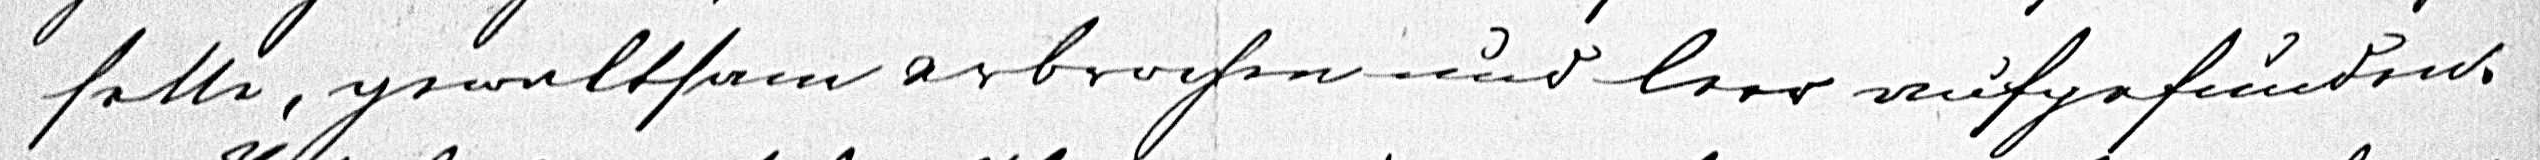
sette, gewaltsam erbrochen und leer aufgefunden.
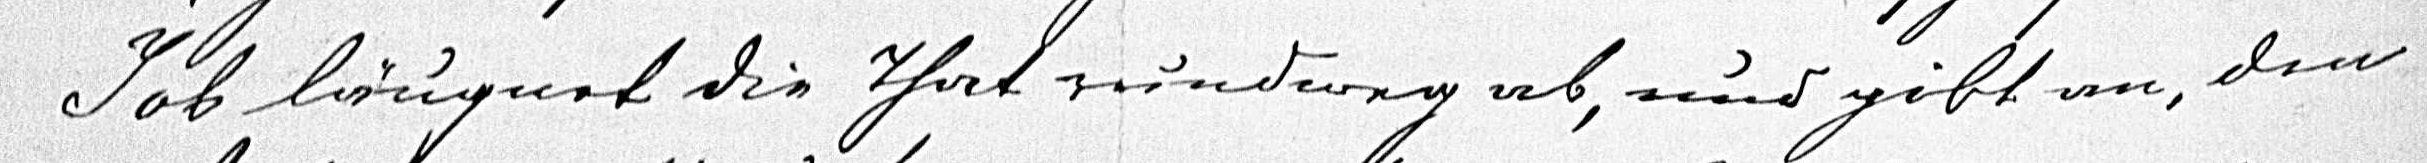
Job läugnet die That rundweg ab, und gibt an, den
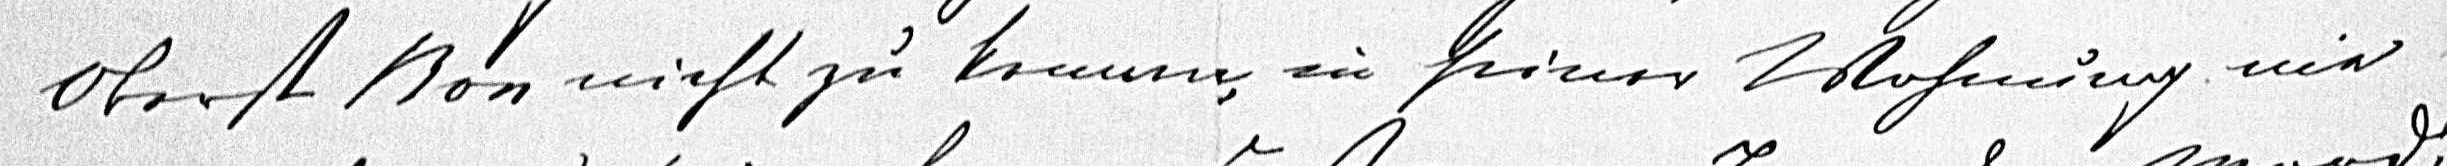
Oberst Bon nicht zu kennen, in seiner Wohnung ein
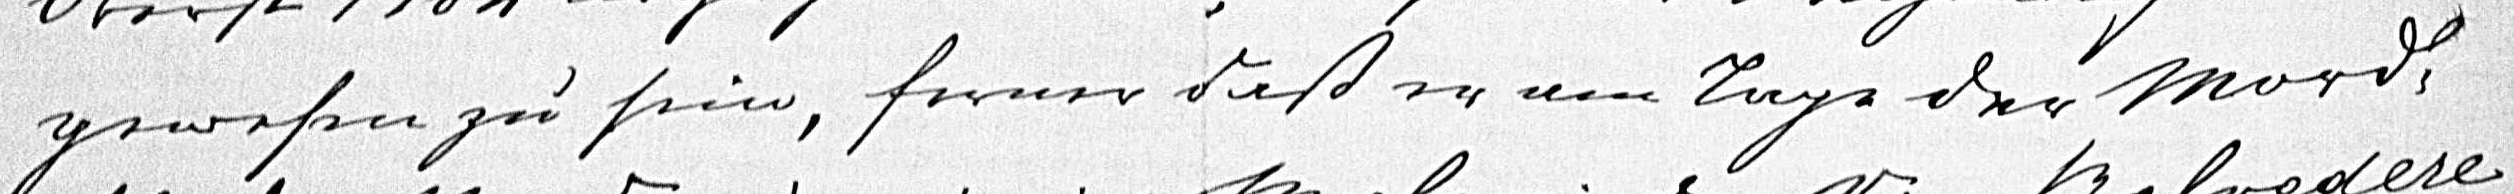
gewesen zu sein, ferner daß er am Tage der Mord¬
